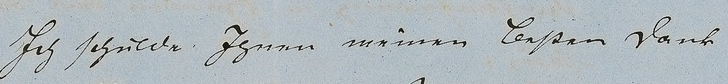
Ich schulde Ihnen meinen besten Dank
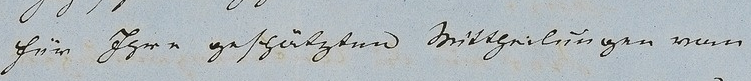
für Ihre geschätzten Mittheilungen vom
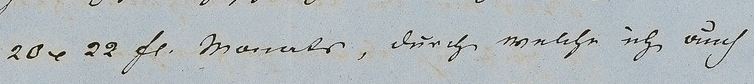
20 & 22 fl. Monats, durch welche ich auch
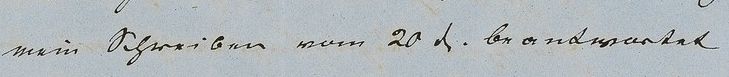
mein Schreiben vom 20 ds. beantwortet
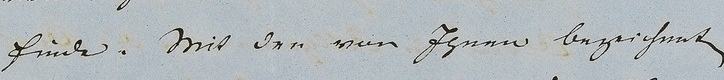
finde. Mit den von Ihnen bezeichneten
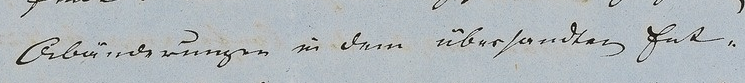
Abänderungen in dem übersandten Ent-
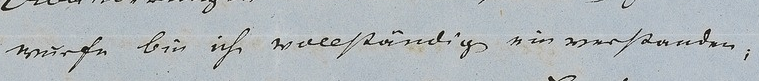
wurfe bin ich vollständig einverstanden;
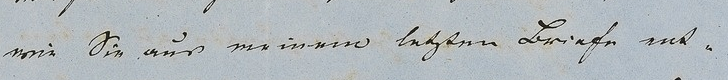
wie Sie aus meinem letzten Briefe ent-
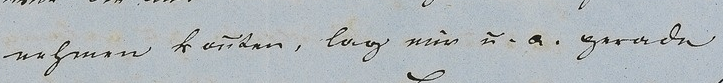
nehmen konnten, lag mir u. a. gerade
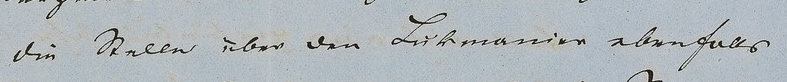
die Stelle über den Lukmanier ebenfalls
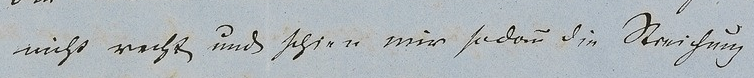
nicht recht und schien mir sodann die Streichung
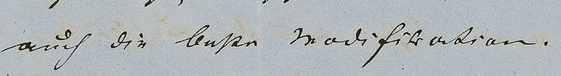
auch die beste Modifikation.
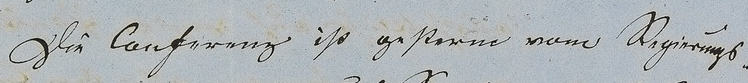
Die Conferenz ist gestern vom Regierungs-
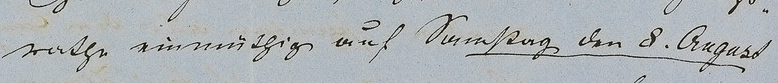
rathe einmüthig auf Samstag den 8. August
